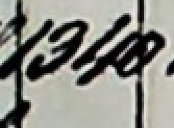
1340
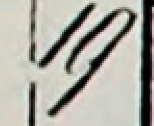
19
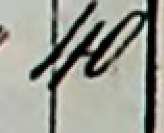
40
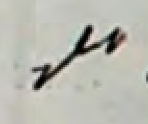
Do
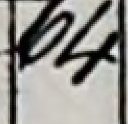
64
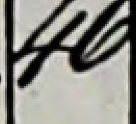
46
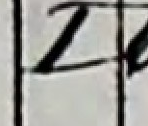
I
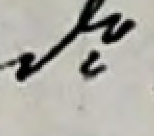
Do
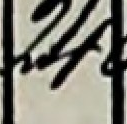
24
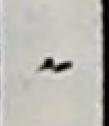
„
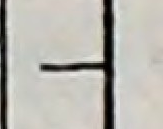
—
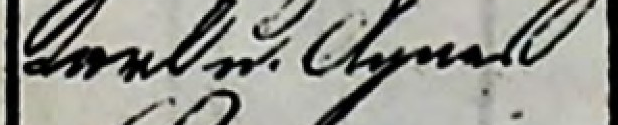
Karl u. Agnes
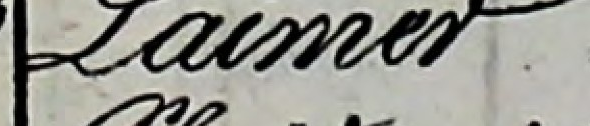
Laimer
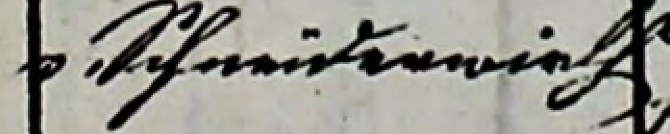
v. Schneiderwirth
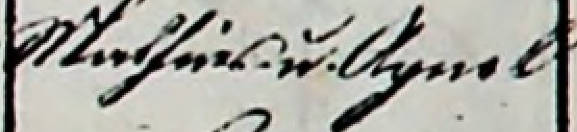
Mathias u. Agnes
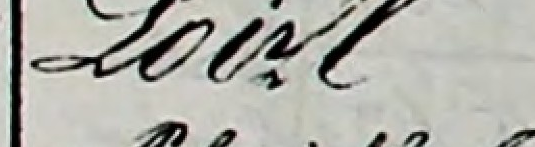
Loidl
